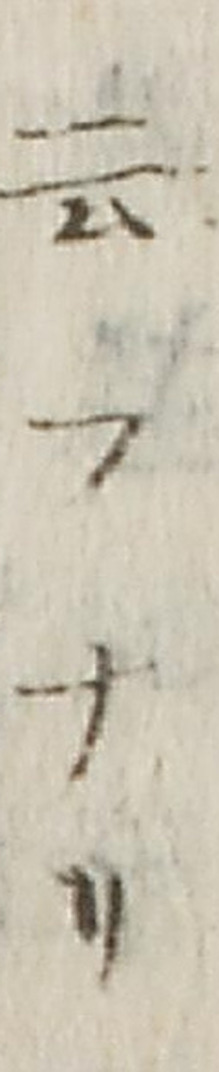云フナリ
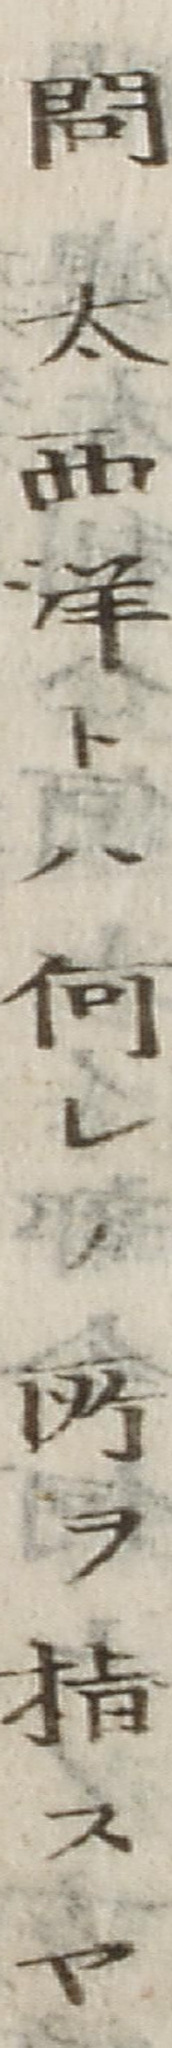問太西洋トハ何レノ所ヲ指スヤ
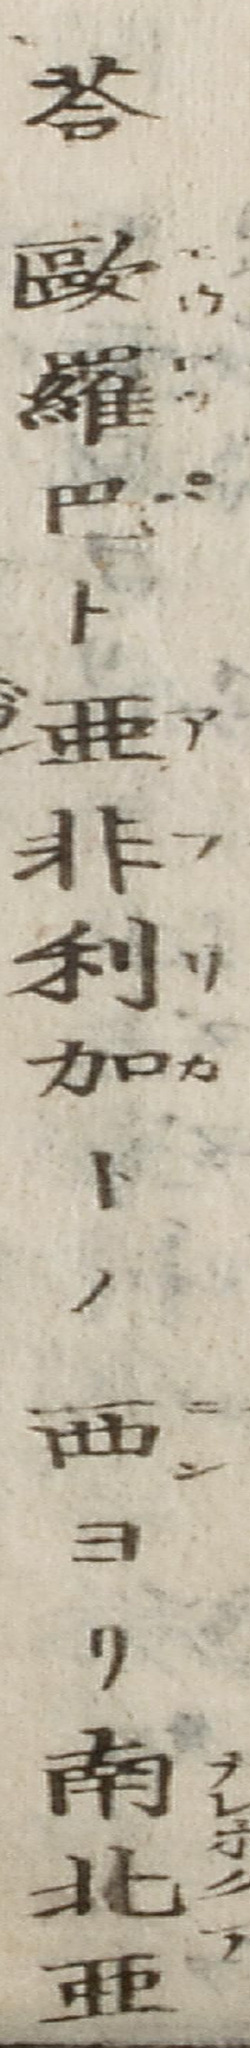答欧羅巴ト阿非利加トノ西ヨリ南北亜
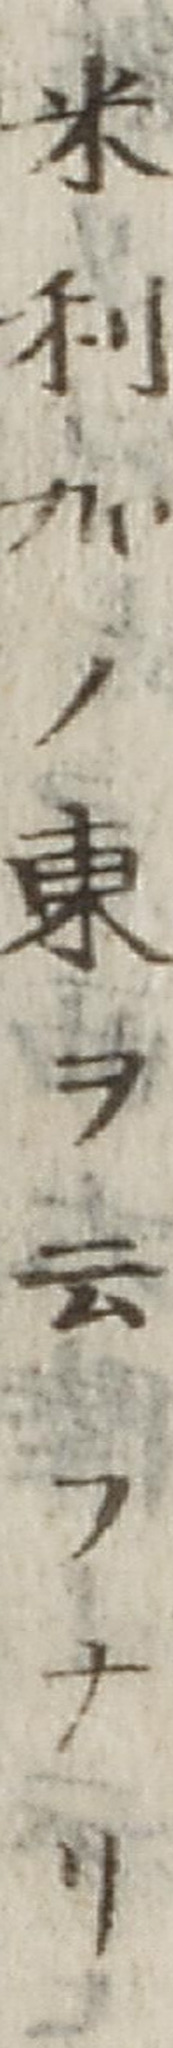米利加ノ東ヲ云フナリ
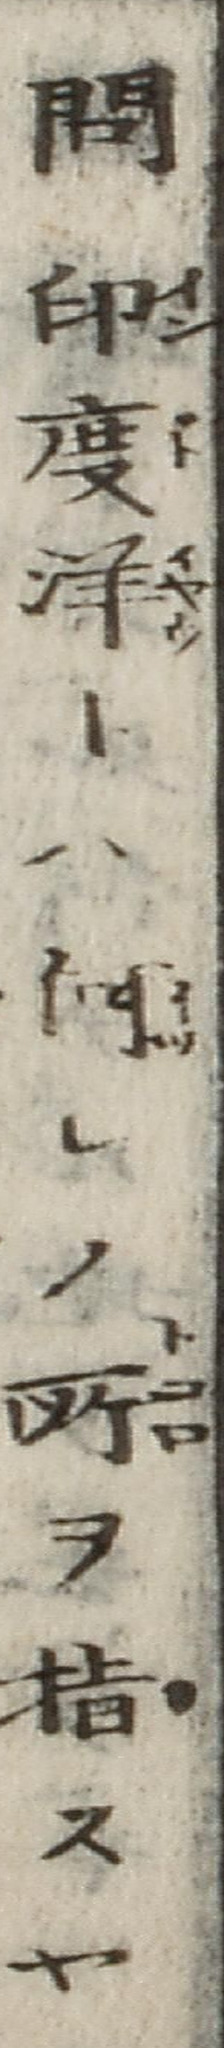問印度洋トハ何レノ所ヲ指スヤ
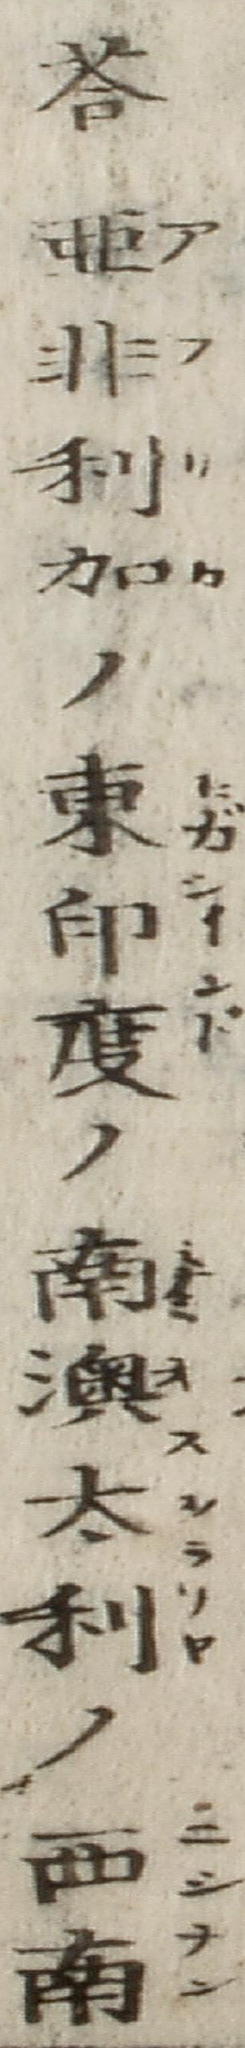答阿非利加ノ東印度ノ南澳太利ノ西南
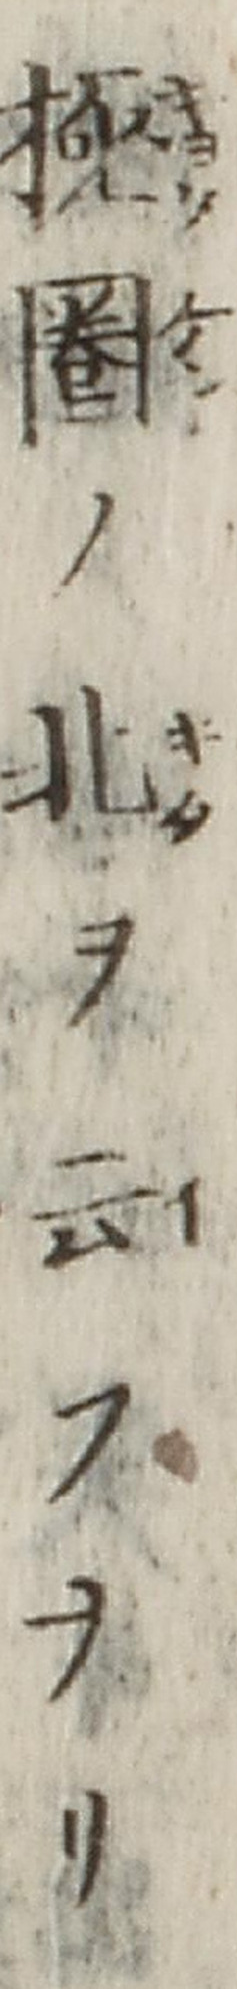極圏ノ北ヲ云フナリ
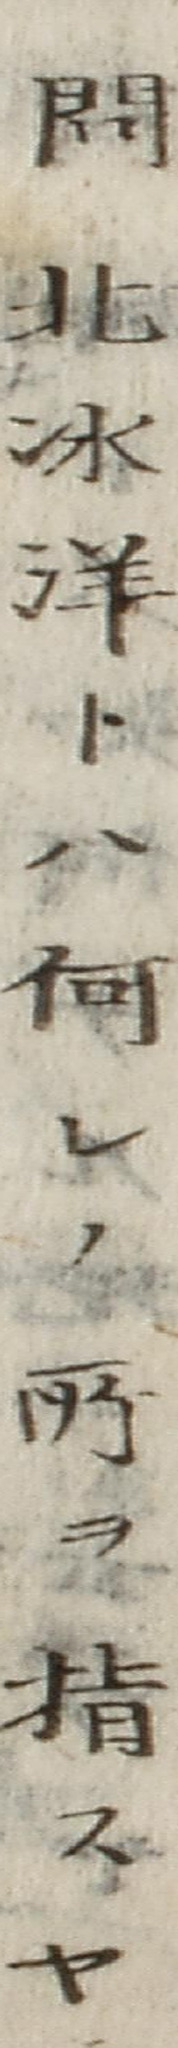問北冰洋トハ何レノ所ヲ指スヤ
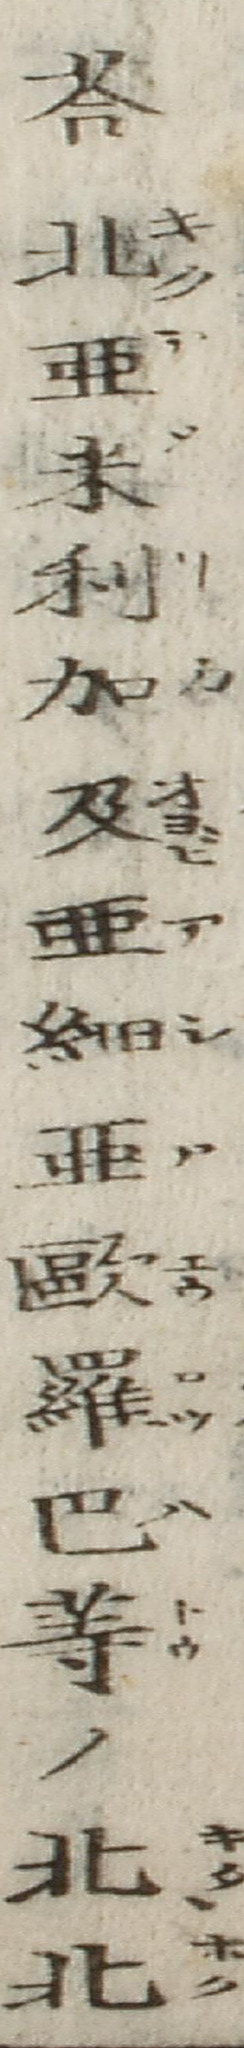答北亜米利加及亜細亜欧羅巴等ノ北、北
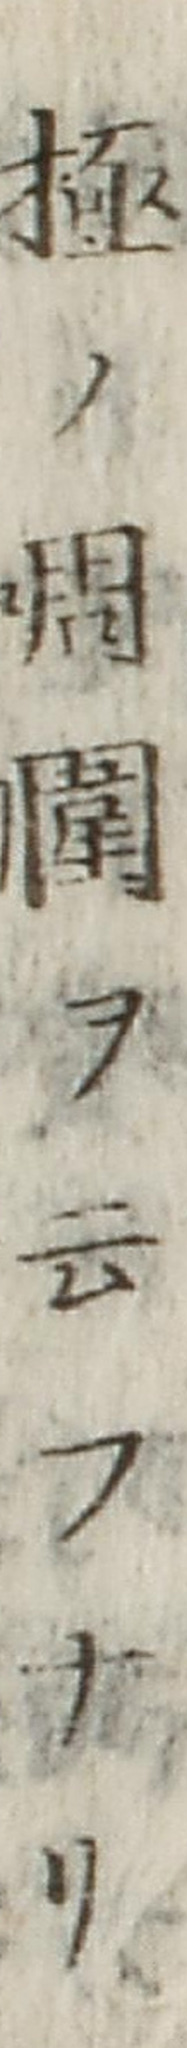極ノ周囲ヲ云フナリ
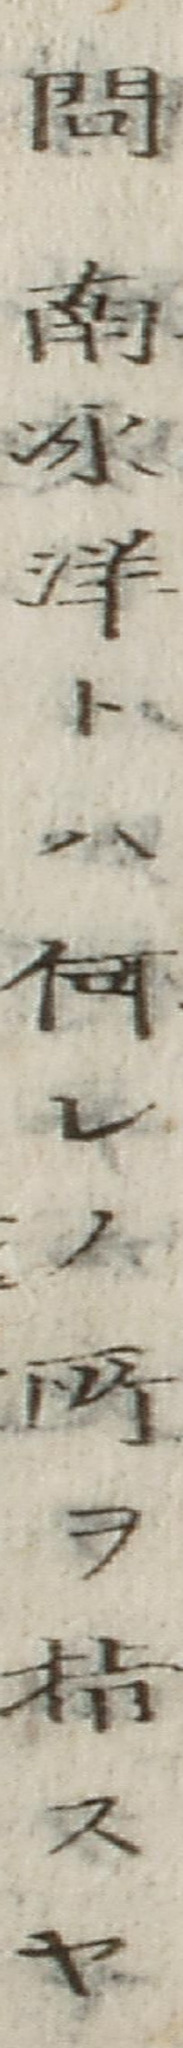問南冰洋トハ何レノ所ヲ指スヤ
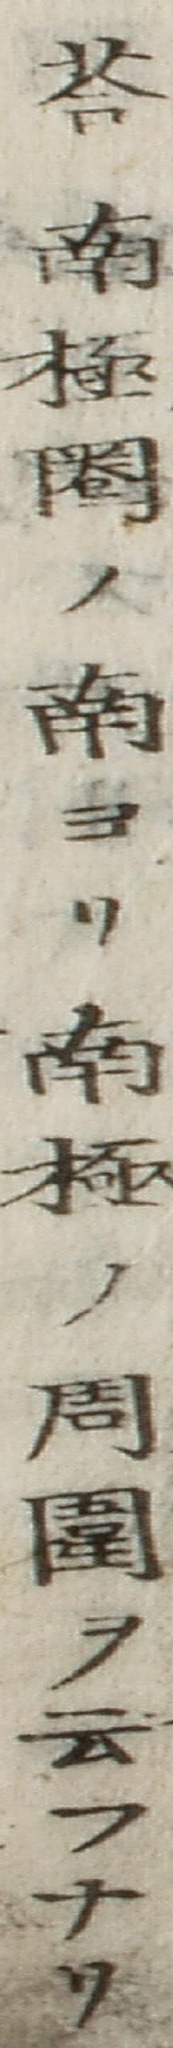答南極圏ノ南ヨリ南極ノ周囲ヲ云フナリ
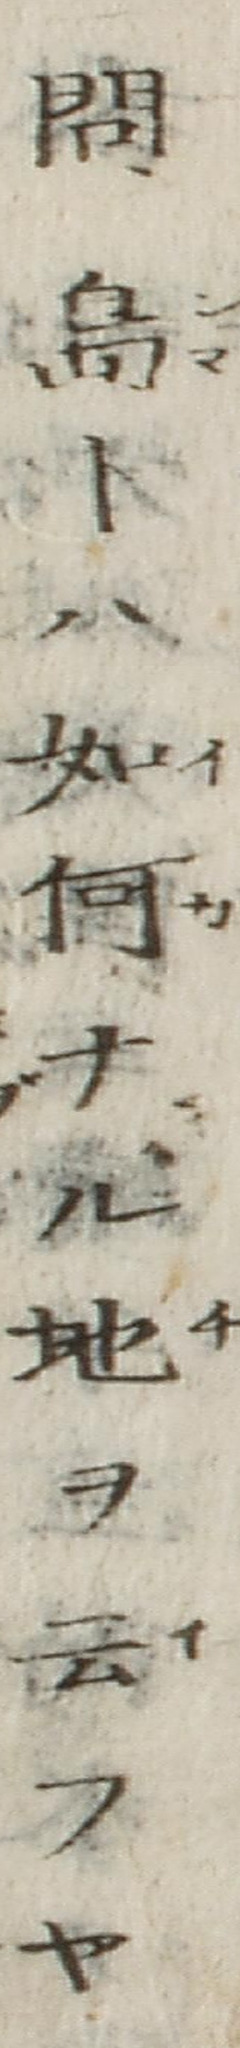問島トハ如何ナル地ヲ云フヤ
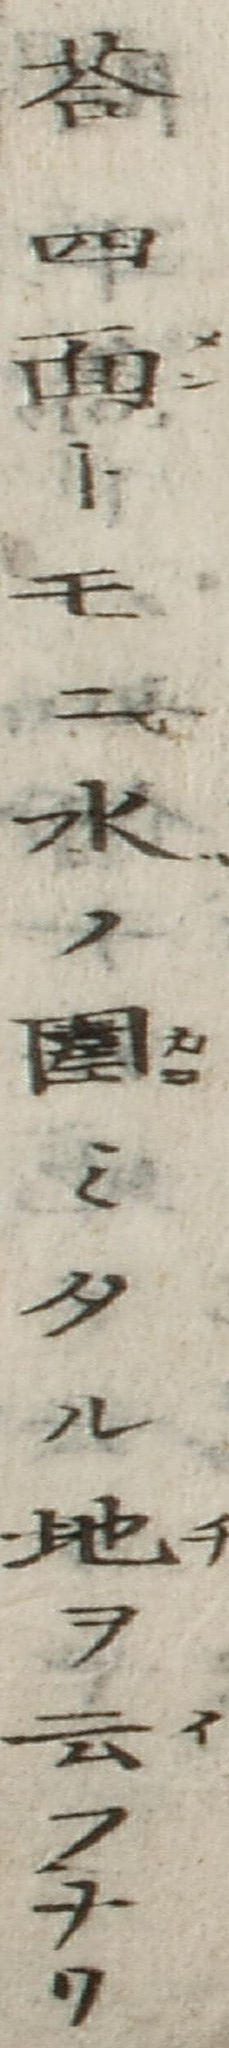答四面トモニ水ノ囲ミタル地ヲ云フナリ

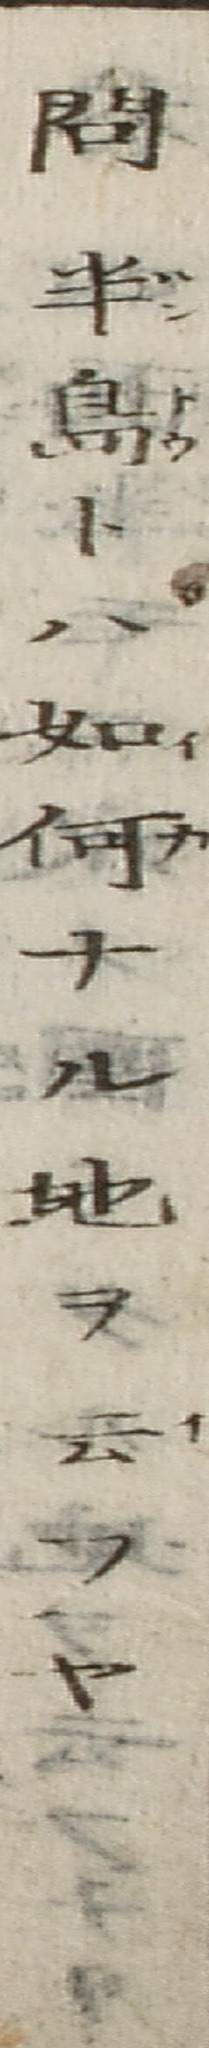問半島トハ如何ナル地ヲ云フヤ
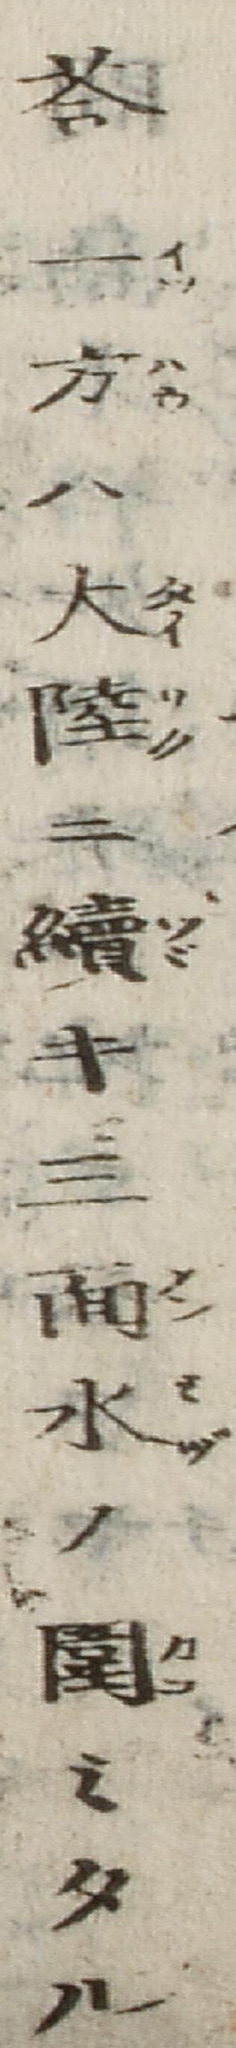答一方ハ大陸ニ續キ三面水ノ圍ミタル
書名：地球儀問答　全
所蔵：東京大学地震研究所図書室 Earthquake Research Institute Library, The University of Tokyo, JAPAN
